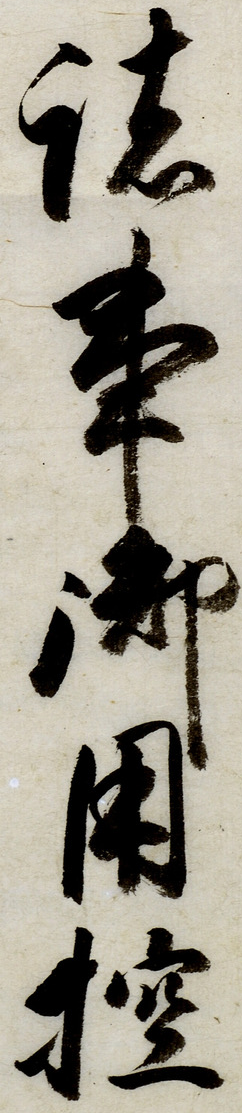諸事御用控
